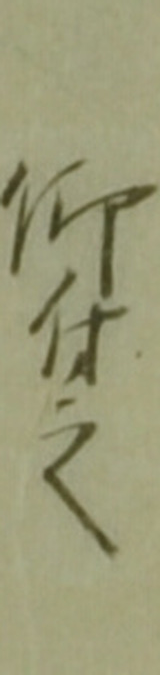仰付之
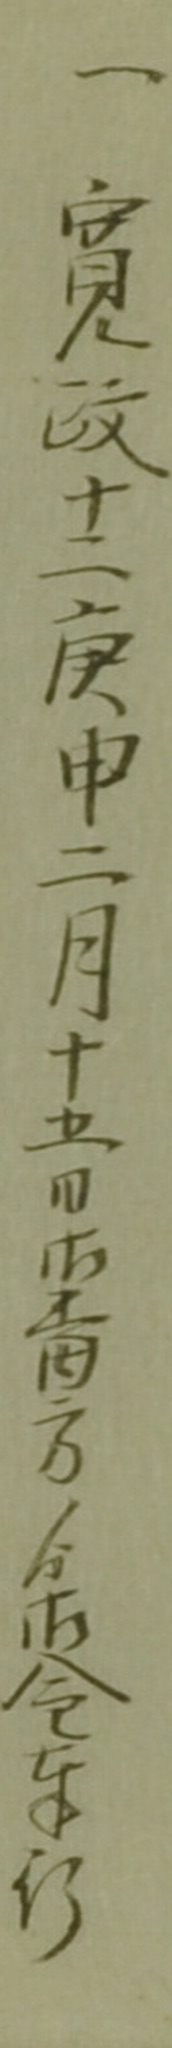一寛政十二庚申二月十五日御番方ゟ御金奉行
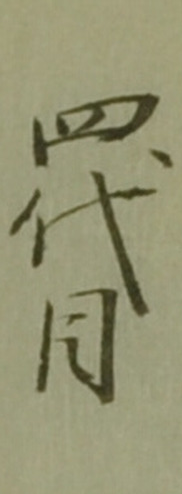四代目
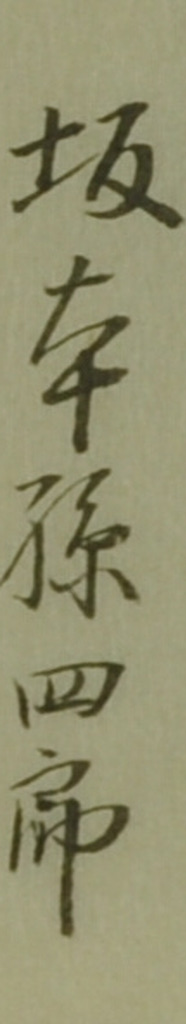坂本孫四郎
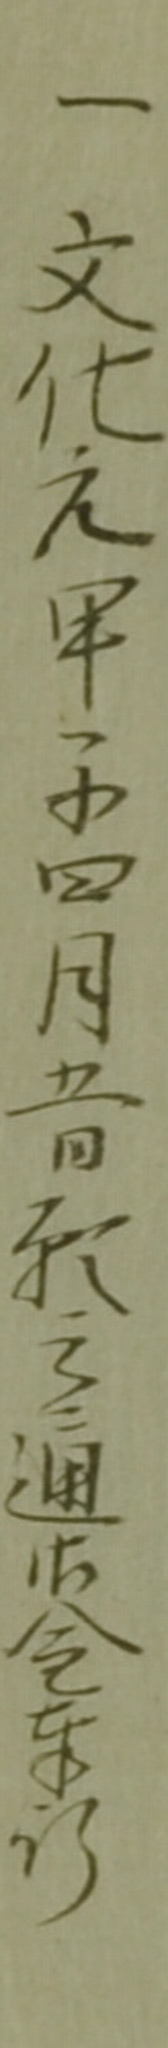一文化元甲子四月五日願之通御金奉行
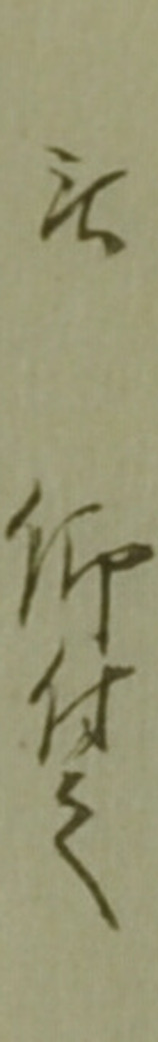被仰付之
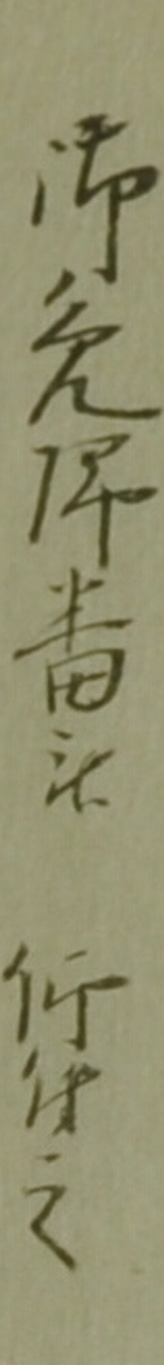御免帰番被仰付之
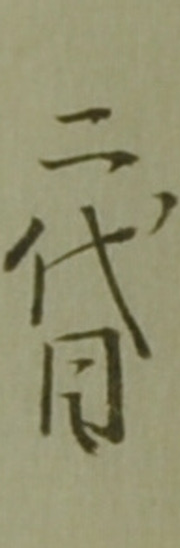二代目
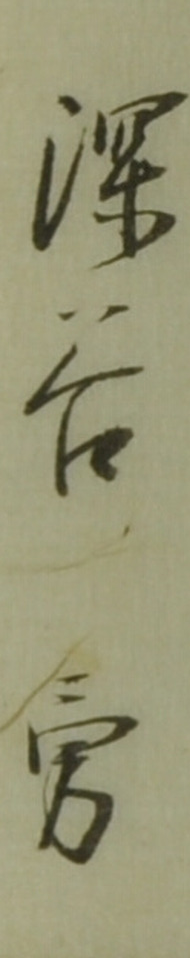深谷勇

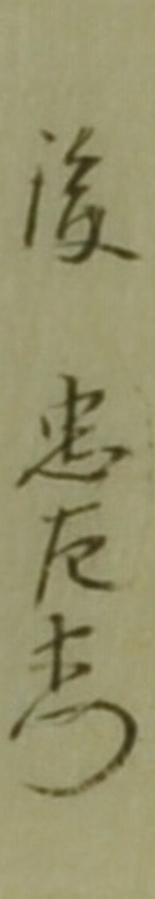後忠左衛門
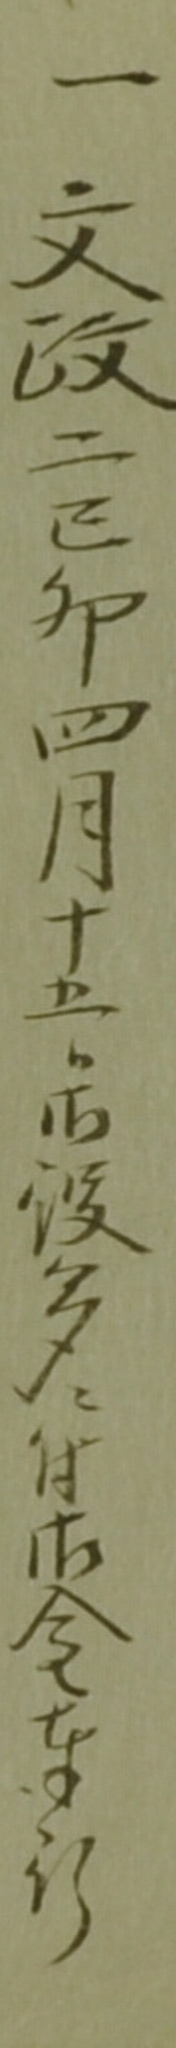一文政二己卯四月十五日御役多ニ付御金奉行
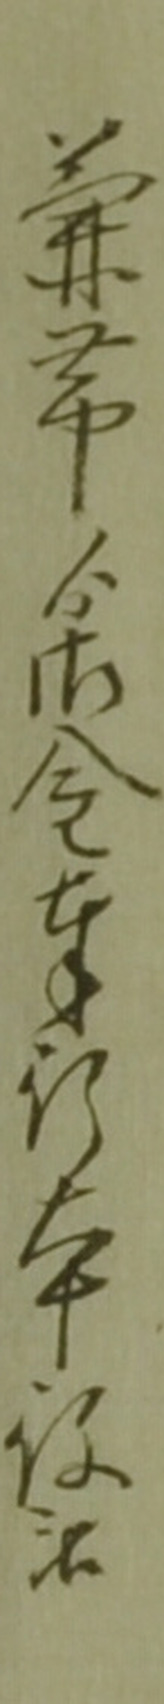兼帯ゟ御金奉行本役被
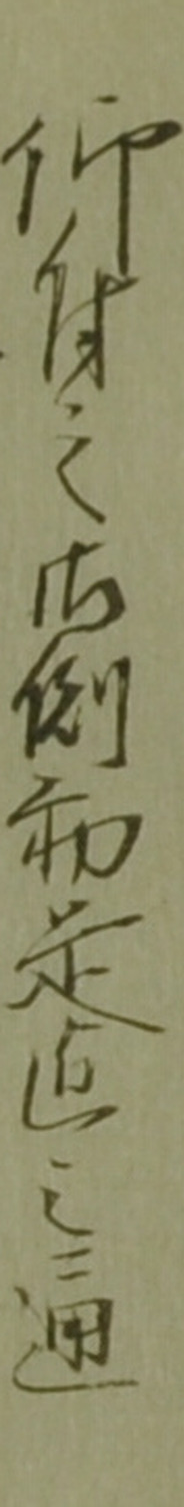仰付之御側勤是迄之通
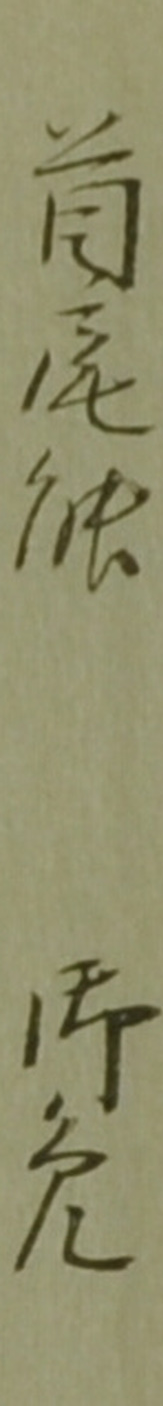首尾能御免
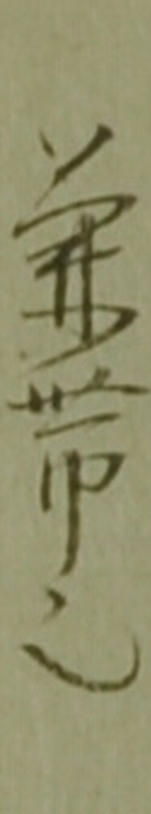兼帯也
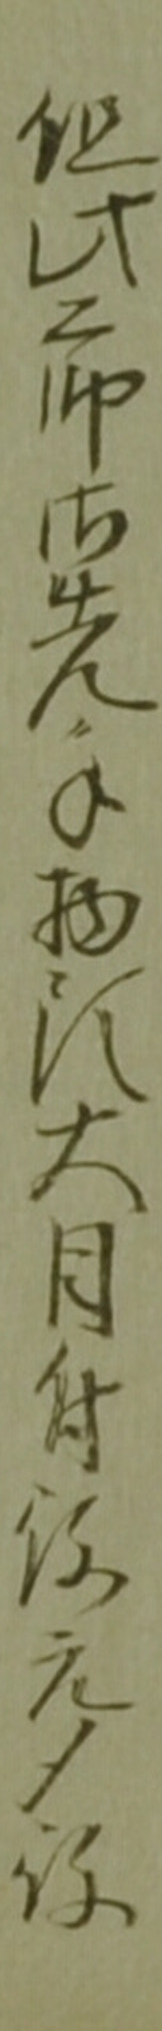但此節御先手物頭大目付役元〆役
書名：諸御役代々録（七）
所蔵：伊那市立高遠町図書館・合同会社AMANE
